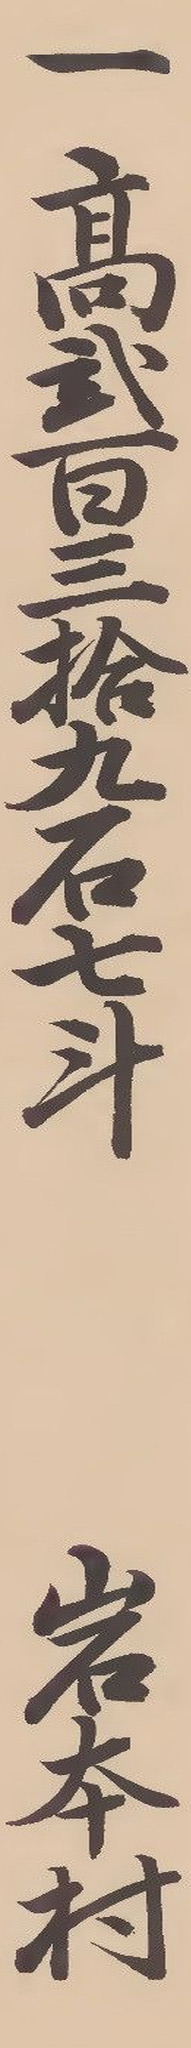一高弐百三拾九石七斗岩本村
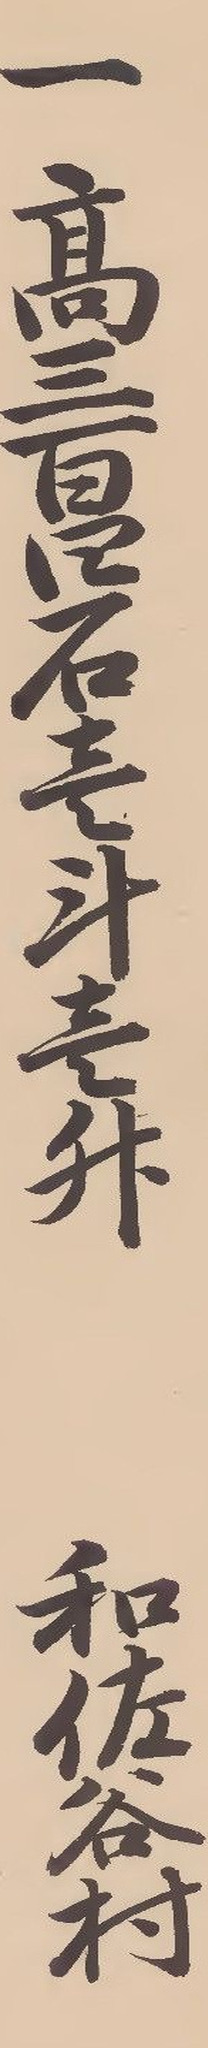一高三百四石壱斗壱升和佐谷村
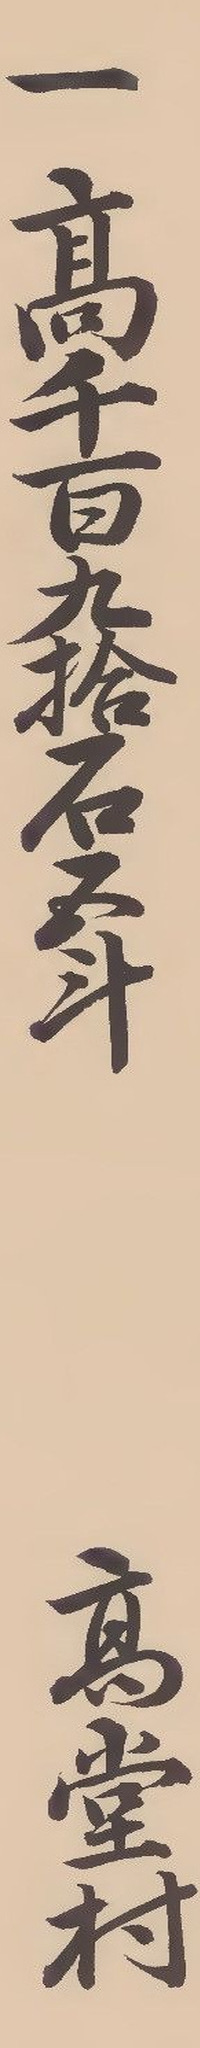一高千百九拾石五斗高堂村
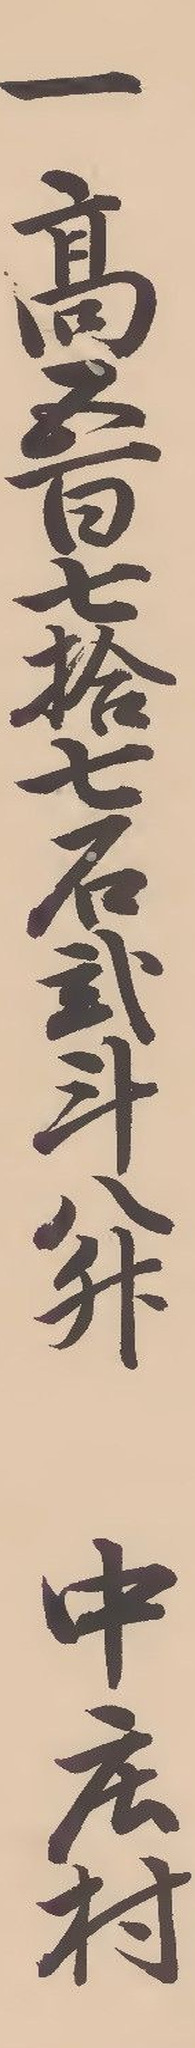一高五百七拾七石弐斗八升中庄村

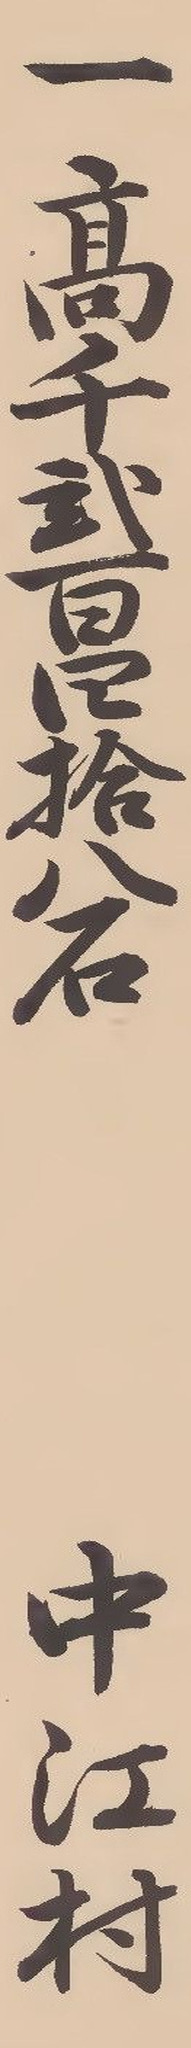一高千弐百四拾八石中江村
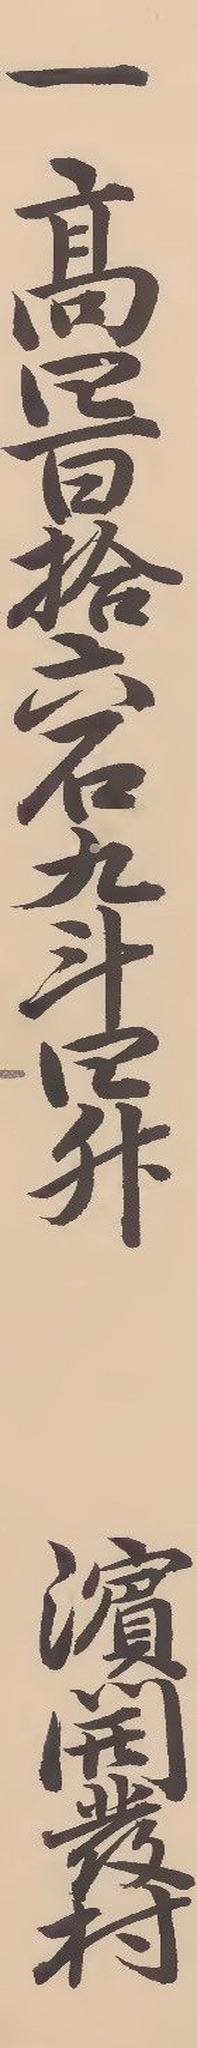一高四百拾六石九斗四升浜開発村

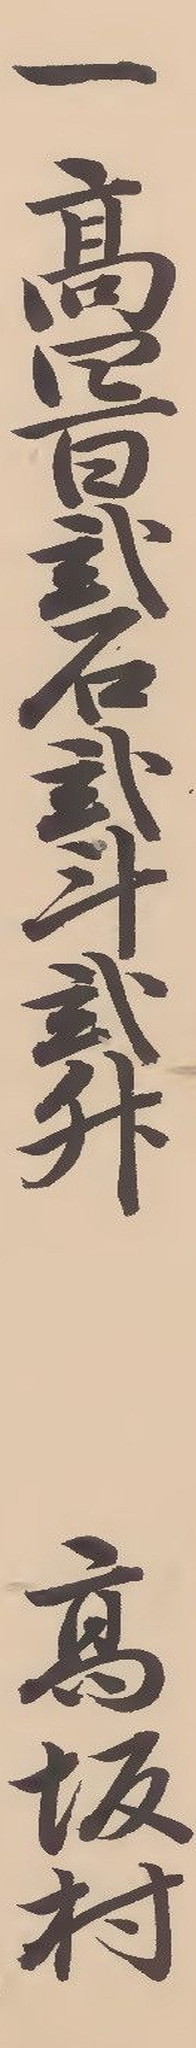一高四百弐石弐斗弐升高坂村
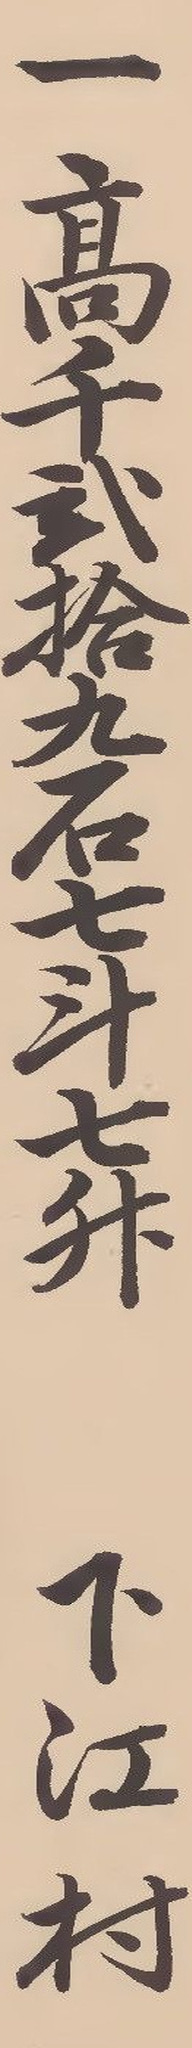一高千弐拾九石七斗七升下江村
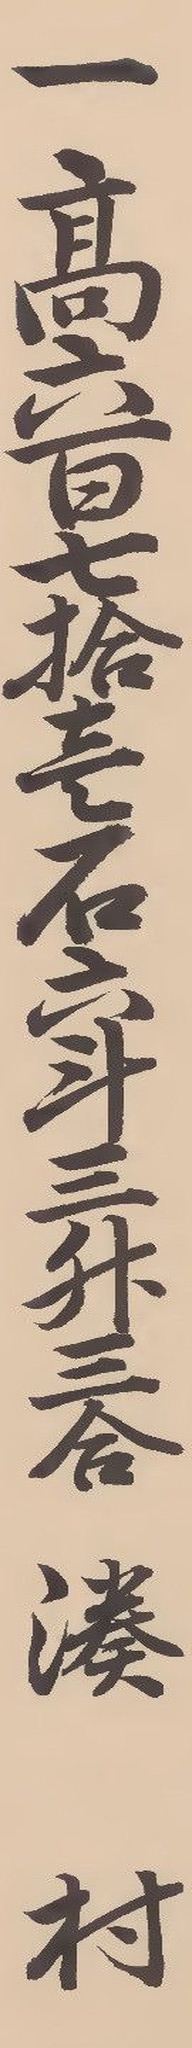一高六百七拾壱石六斗三升三合湊村
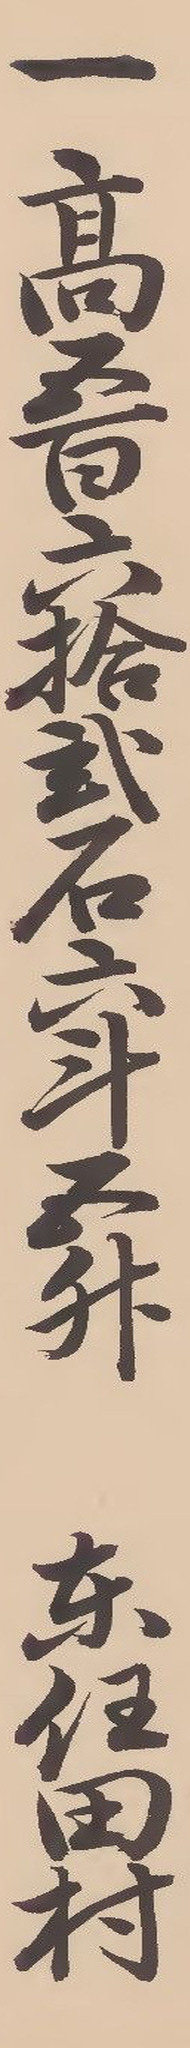一高五百六拾弐石六斗五升東任田村
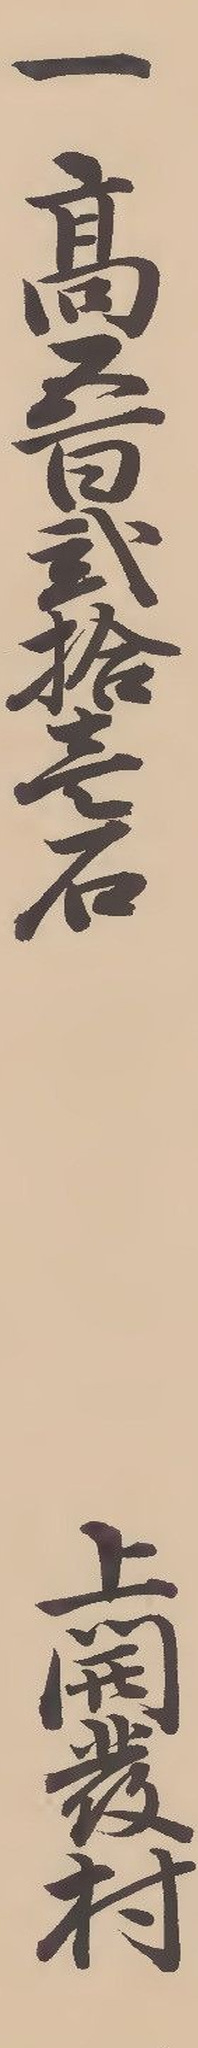一高五百弐拾壱石上開発村
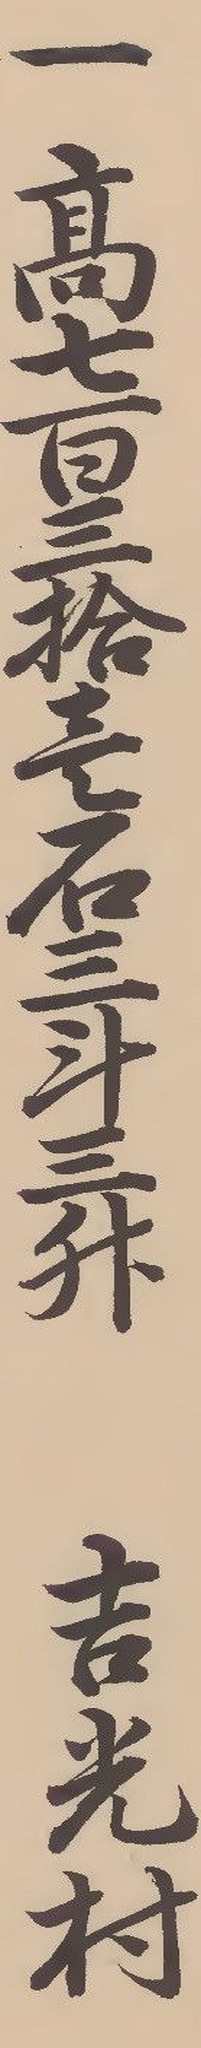一高七百三拾壱石三斗三升吉光村

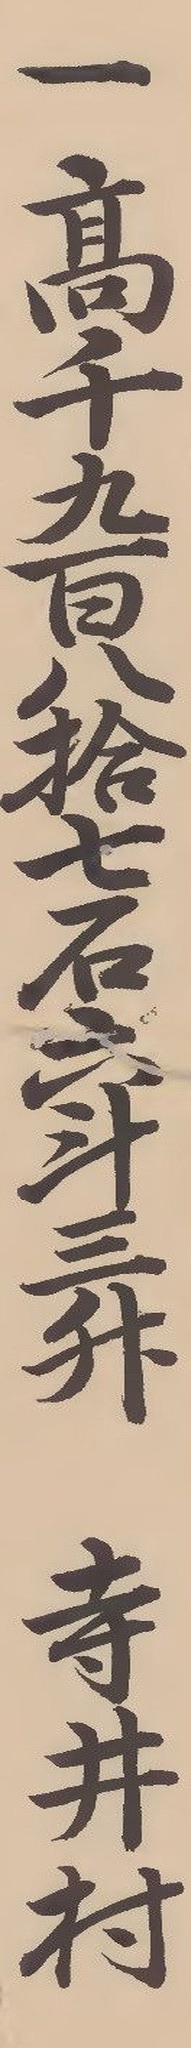一高千九百八拾七石六斗三升寺井村
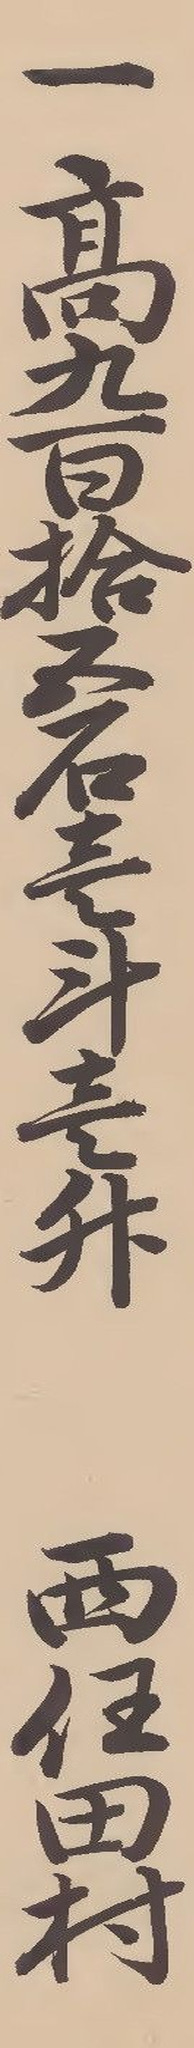一高九百拾五石壱斗壱升西任田村
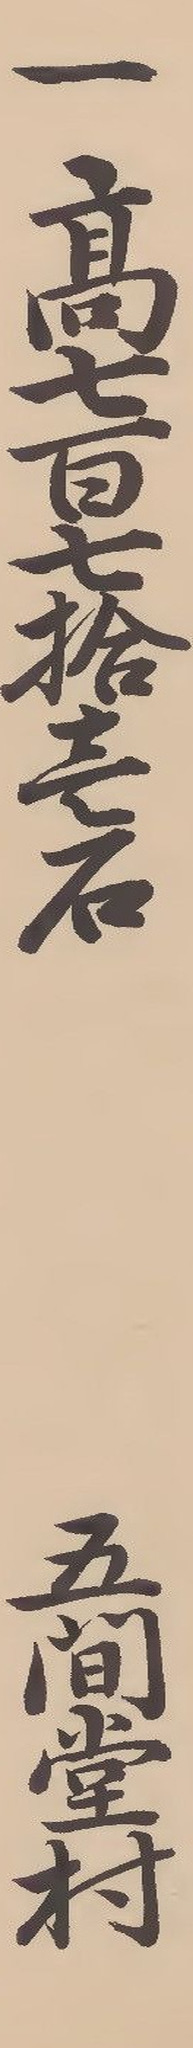一高七百七拾壱石五間堂村
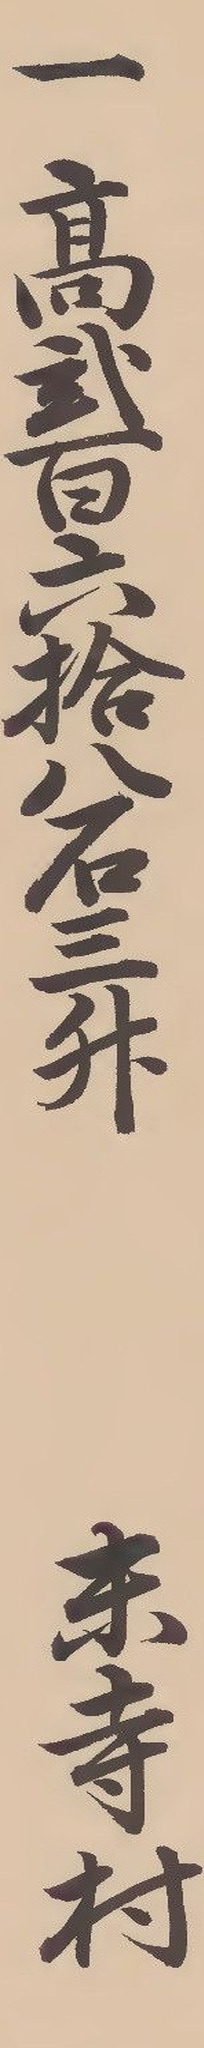一高弐百六拾八石三升末寺村
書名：加賀国郷帳
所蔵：国立公文書館 National Archives of Japan
